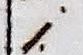1.
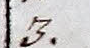3.
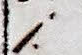1.
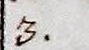3.
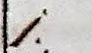1.
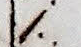1.
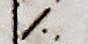1.
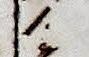1.
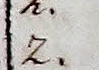2.
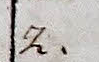2.
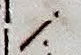1.
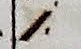1.
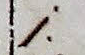1.
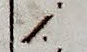1.
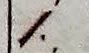1.
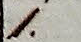1.
